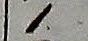1.
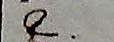2.
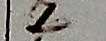2
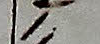1.
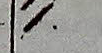1.
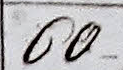60
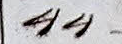44
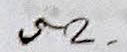52
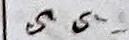55
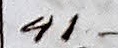41
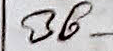36
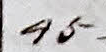45
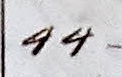44
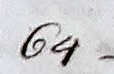64
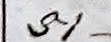51
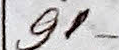91
